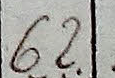62.
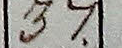37.
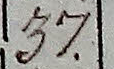37.
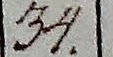34.
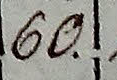60.
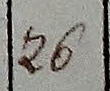26
